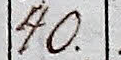40.
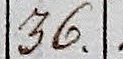36.
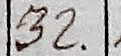32.
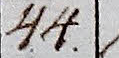44.
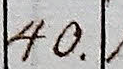40.
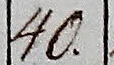40.
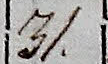31.
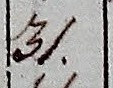31.
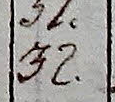32.
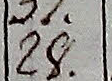28.
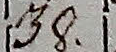38.
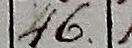46.
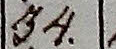34.
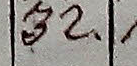32.
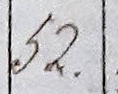52.
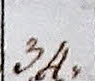34
